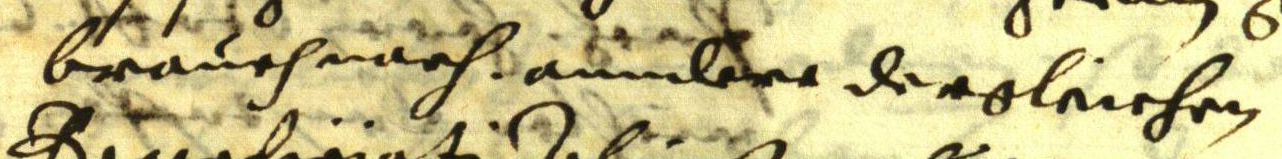braūch noch. anndere dergleichen
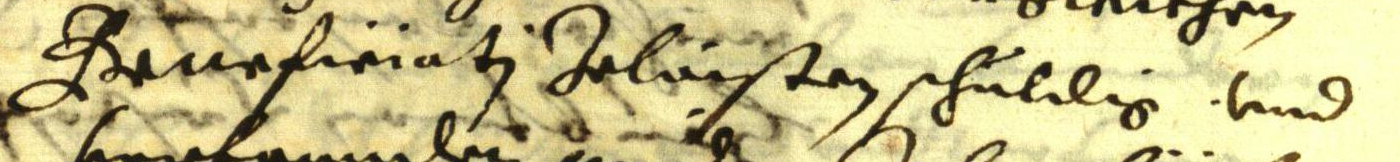Beneficiati Zelaisten schūldig. vnd
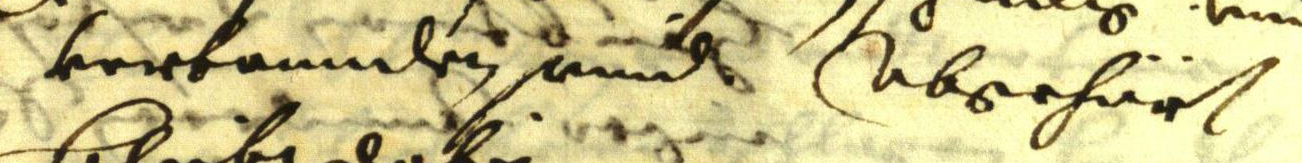verbannden sindt. Abgehört.
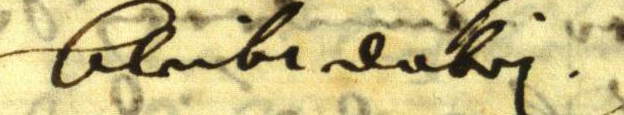bleibt dabej.
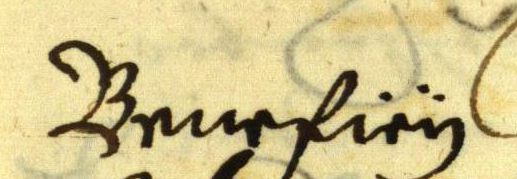Beneficÿ
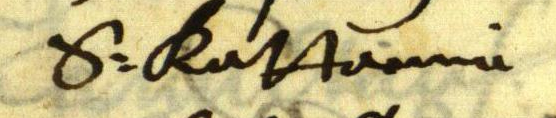S: Kattarina
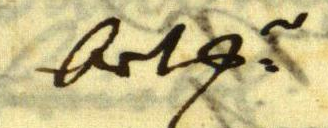bet:
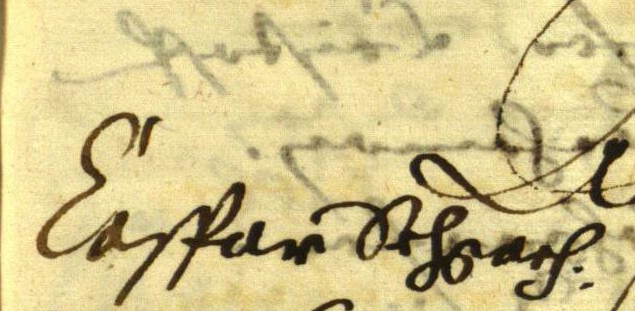Caspar Schgach¬
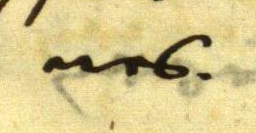nes.
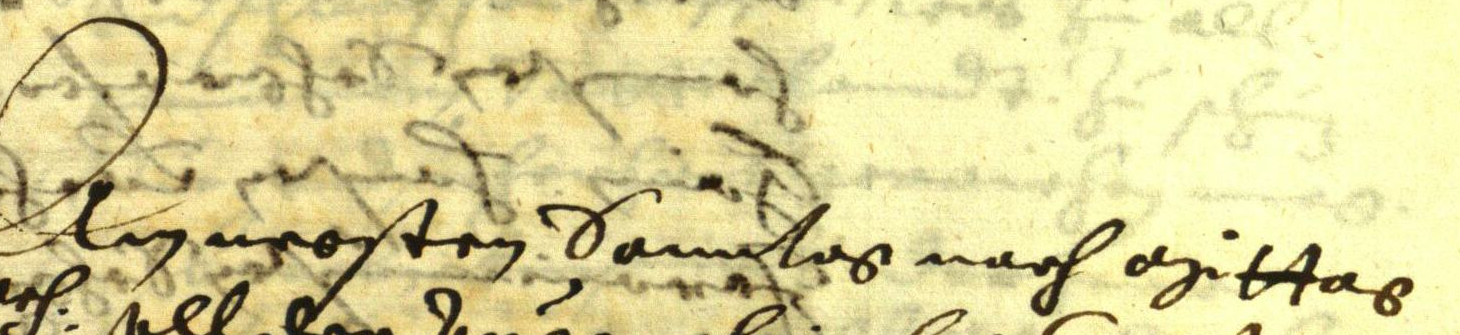Am negsten Sonntag nach Mittag
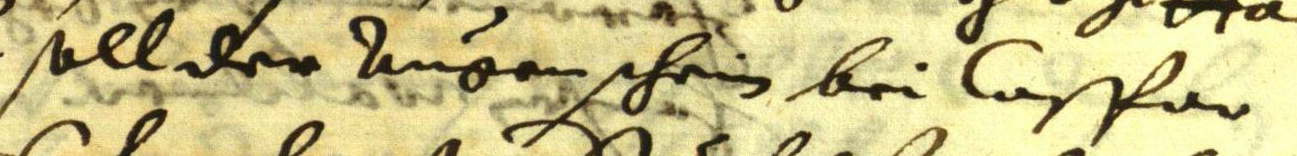soll der Aūgenschein bei Caspar
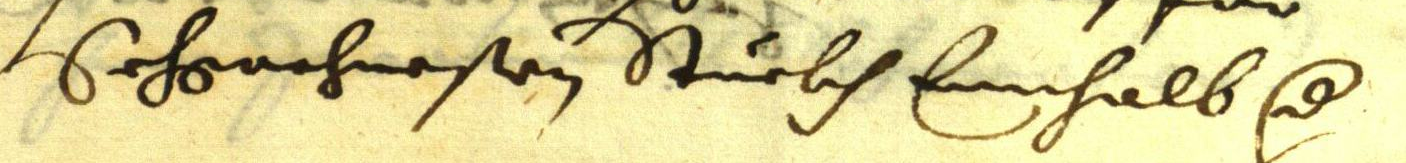Schgachnesen Stūckh Ennhalb d
